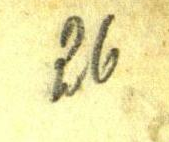26
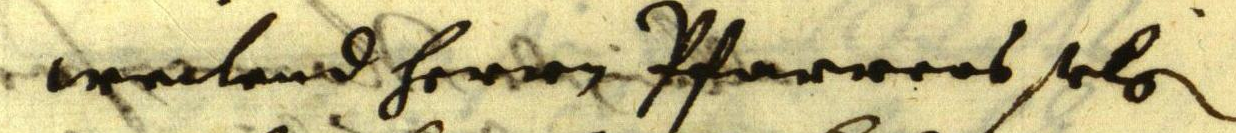weiland herrn Pfarrers selig
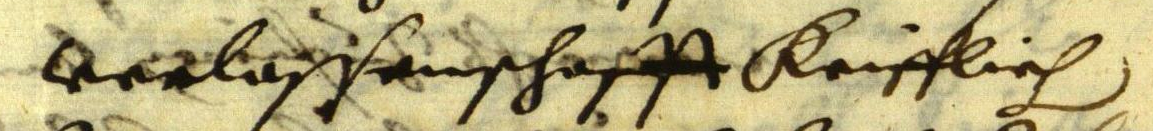verlassenschafft Keifflich
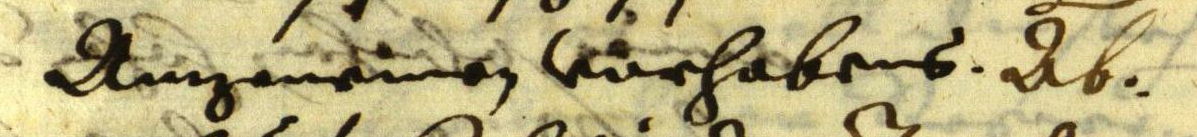Anzenemen vorhabens. Ab¬
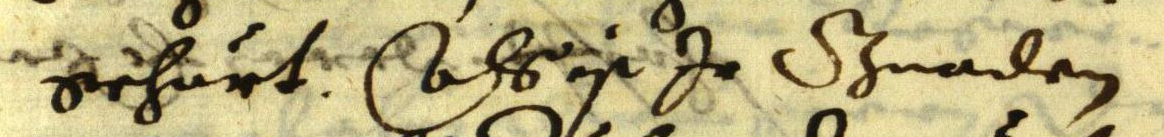gehōrt. Als ist Ir Gnaden
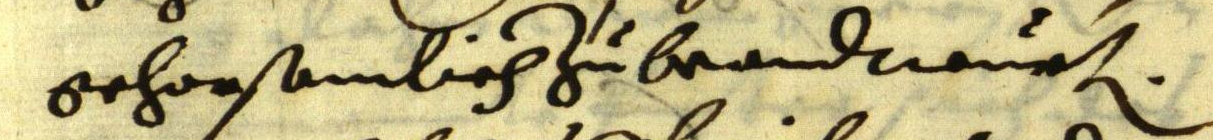gehorsamlich Zū beandtwūrt.
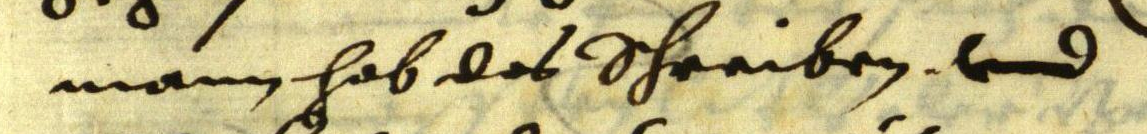mann hab das Schreiben. vnd
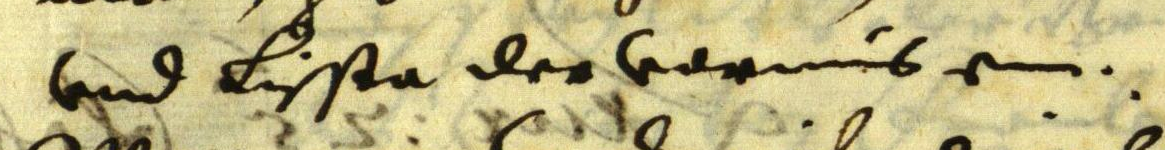vnd Lissta der vermūg em¬
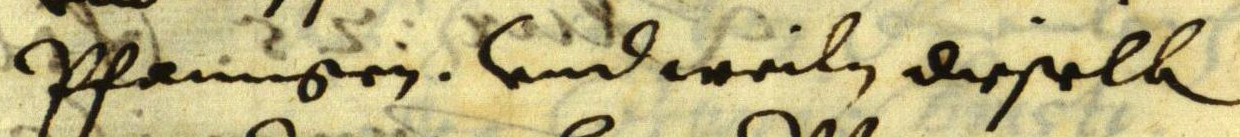Pfanngen. vnd weiln dieselb
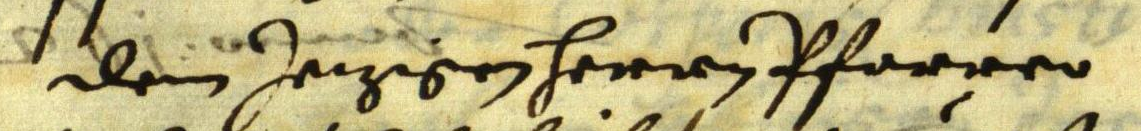dem Jetzigen herrn Pfarrer
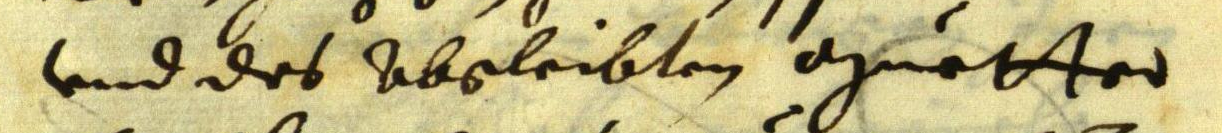vnd des Abgleibten Mūetter
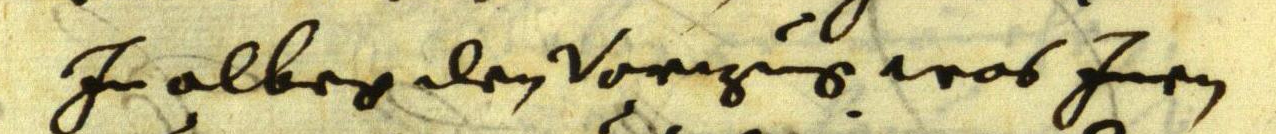In alles den Vorzūg was Inen
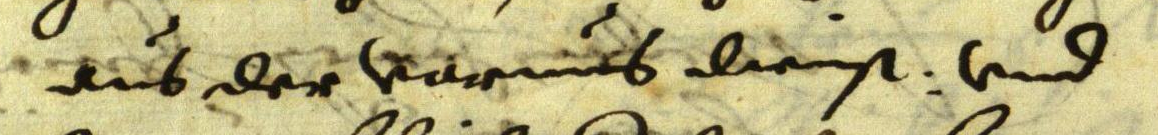aūs der vornūs dienst. vnd
